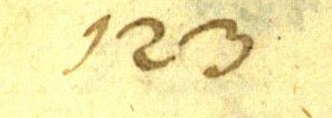123
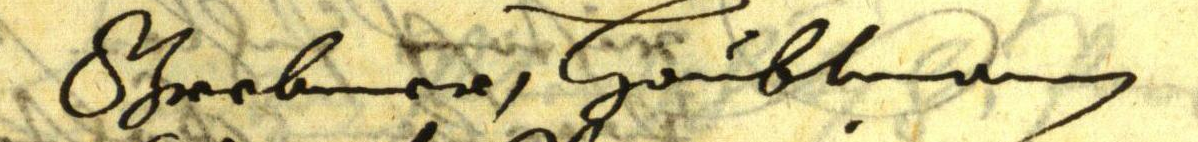Grebmer, Haūbtmann
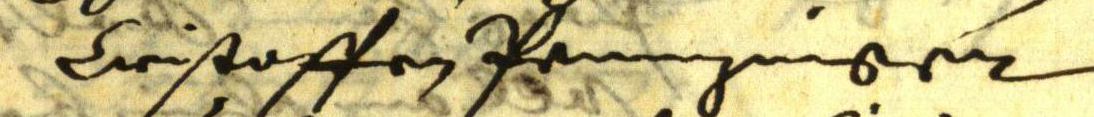Cristoffen Pennzinger
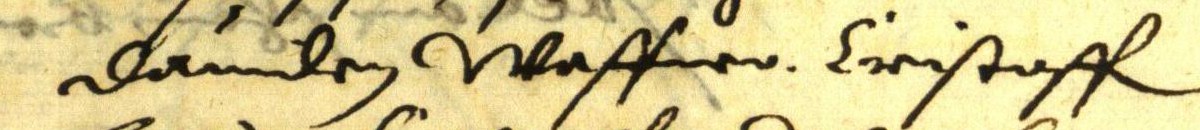Daūiden Waffner. Cristoff
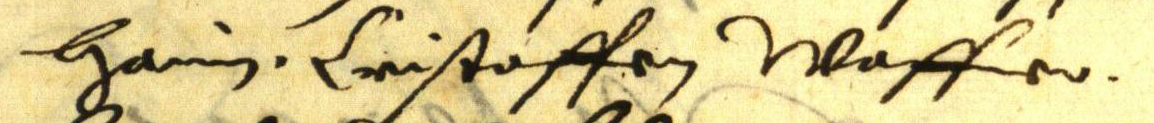Haim. Cristoffen Waffner.
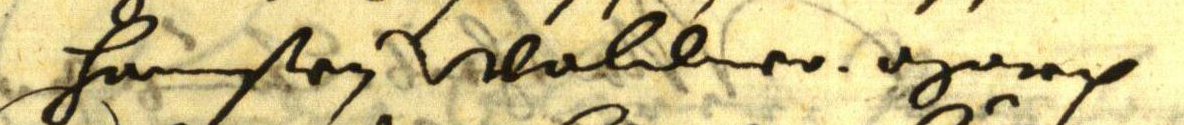hannsen Waldner. Marx
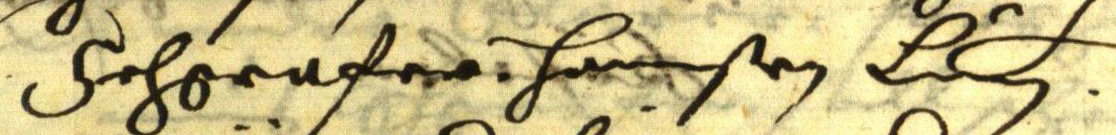Schgrafer. hannsen Lūn.
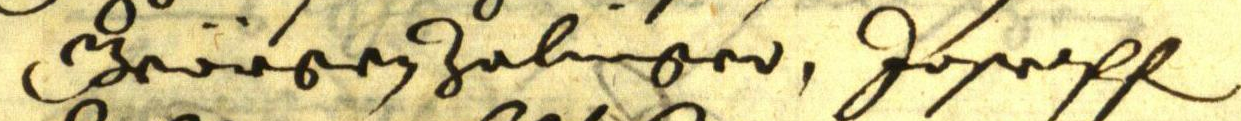Geörgen Zalinger, Joseff
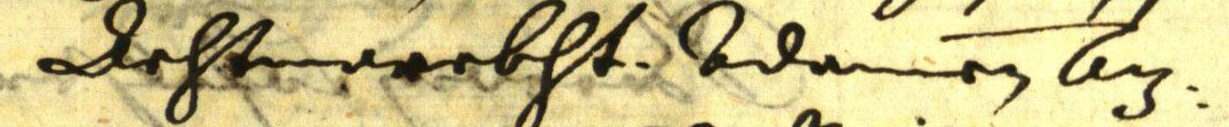Achtmarckht. Adamen Az¬
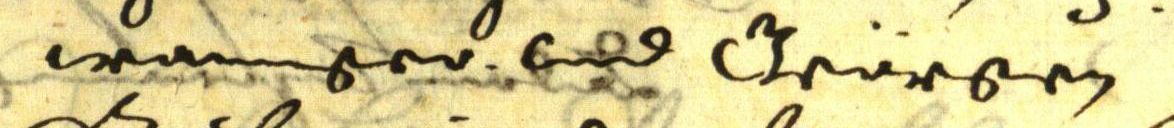wannger. vnd Geörgen
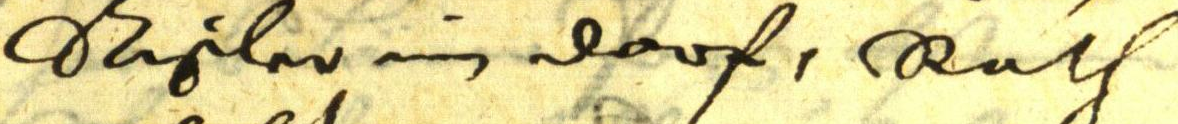Rigler im dorf, Rath
